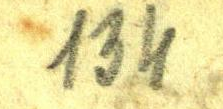134
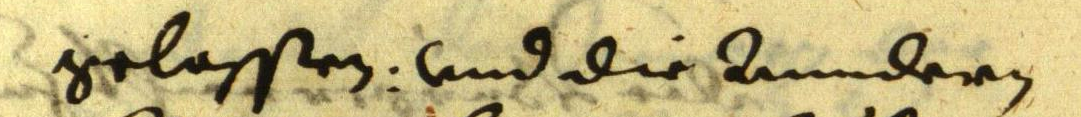gelassen: vnd die Anndern
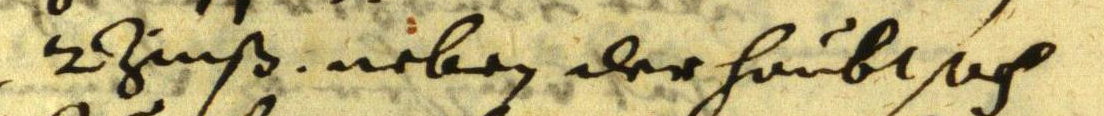2 Zinß. neben der haūbtsach
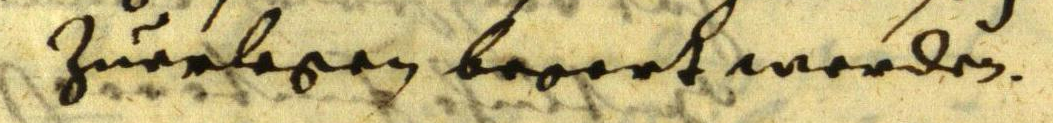Zūerlegen begert werden.
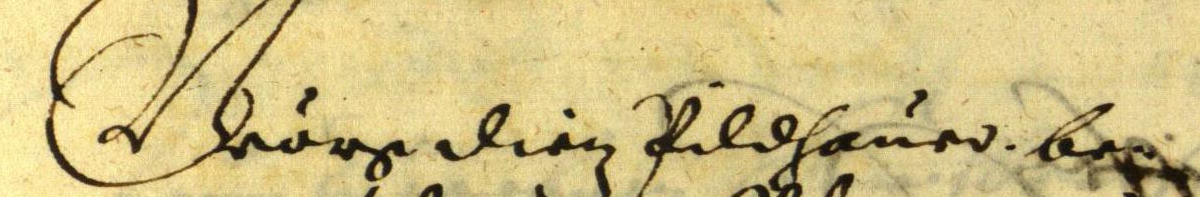Geörg diez Pildhaūer. be¬
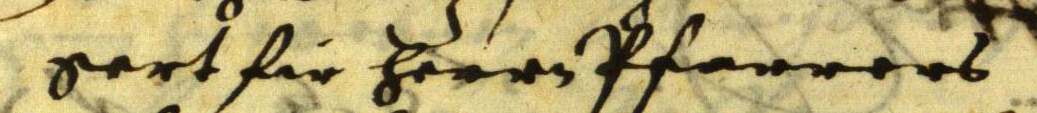gert fir herrn Pfarrers
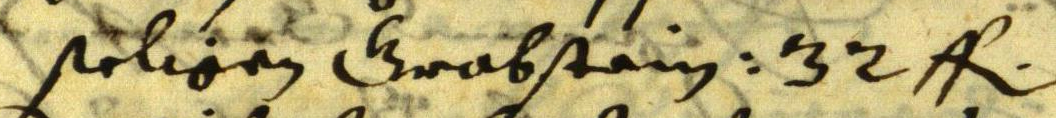seligen Grabstein: 32 fl.
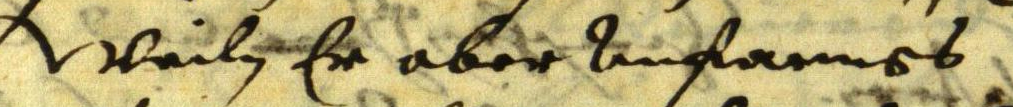Weiln Er aber Anfanngs
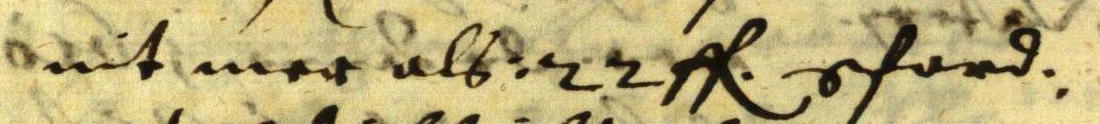nit mer als: 22 fl. gford¬
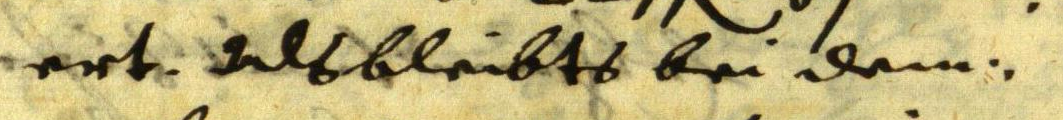ert. als bleibts bei dem¬
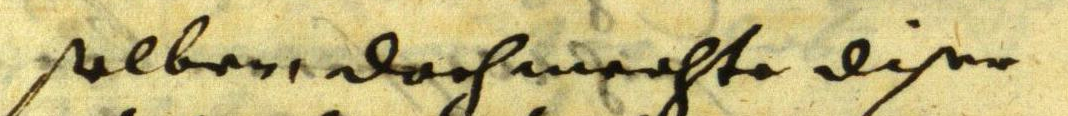selben, doch mechte diser
